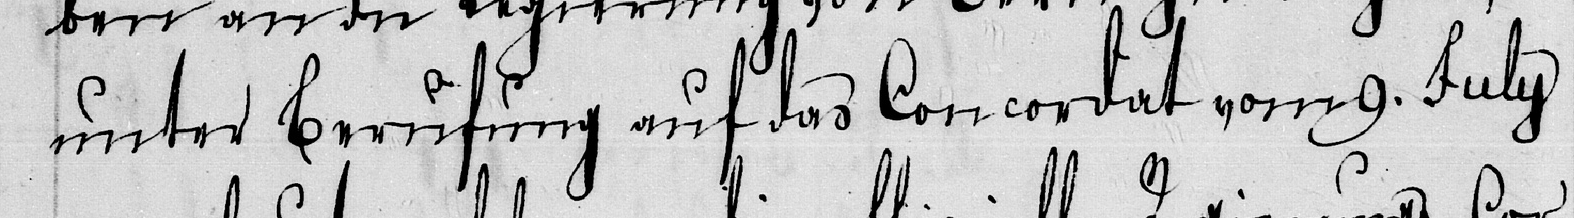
unter Berufung auf das Concordat vom 9. July
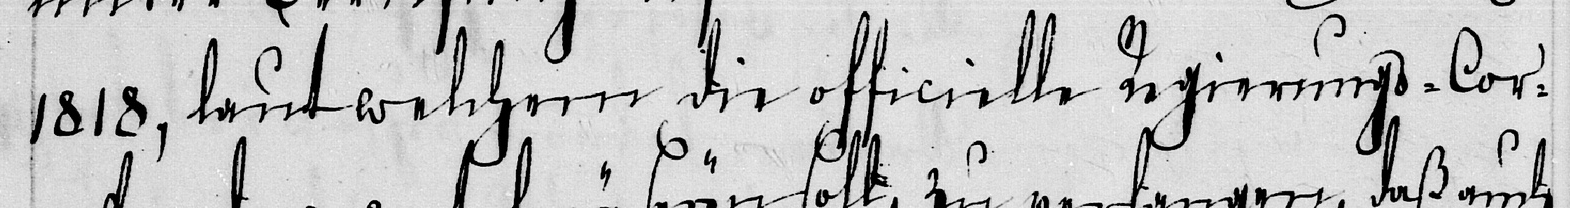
1818, laut welchem die officielle Regierungs-Cor¬
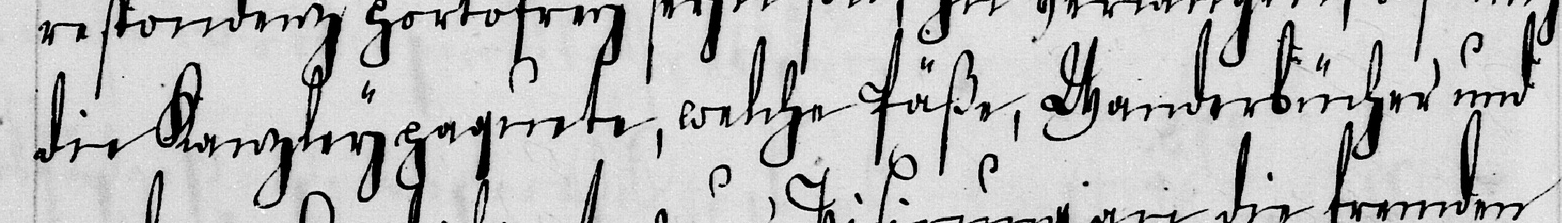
die Kanzleypaquete, welche Päße, Wanderbücher und
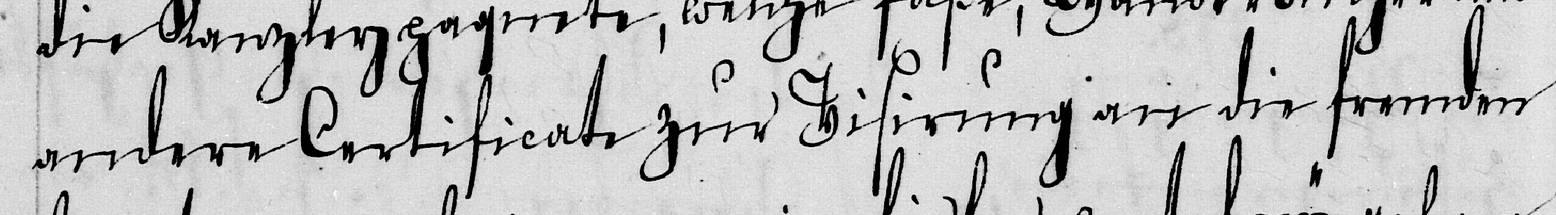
andere Certificate zur Visierung an die fremden
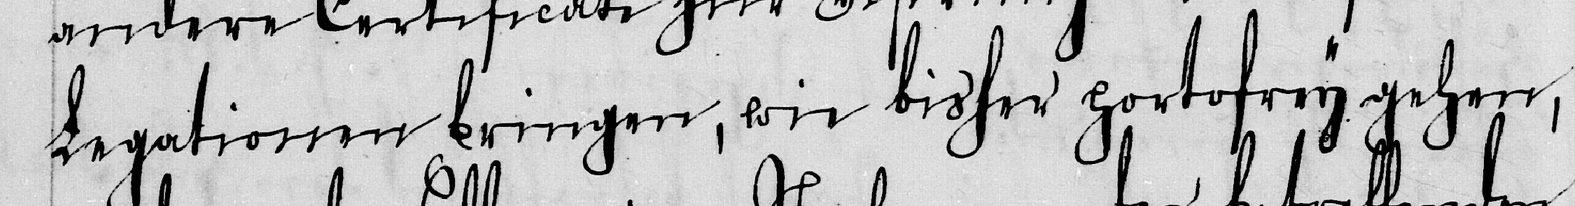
Legationen bringen, wie bisher portofrey gehen,
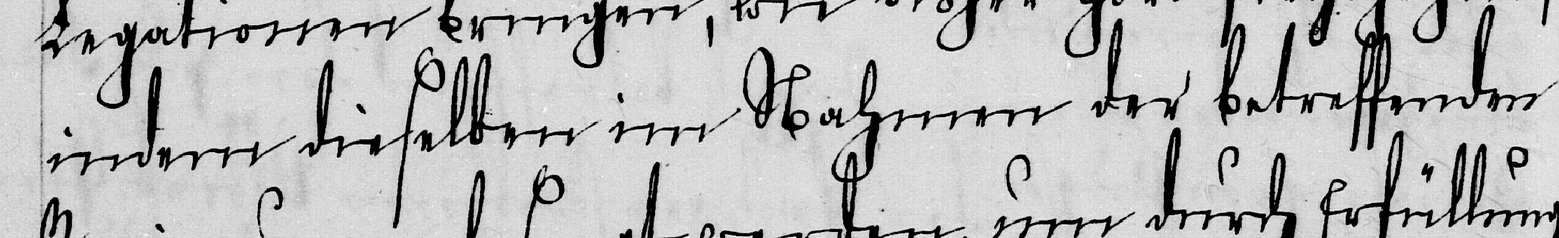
indem dieselben im Nahmen der betreffenden
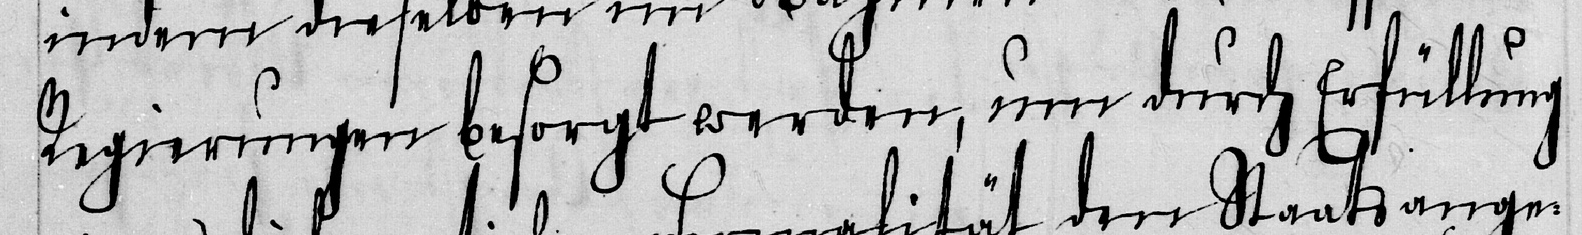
Regierungen besorgt werden, um durch Erfüllung
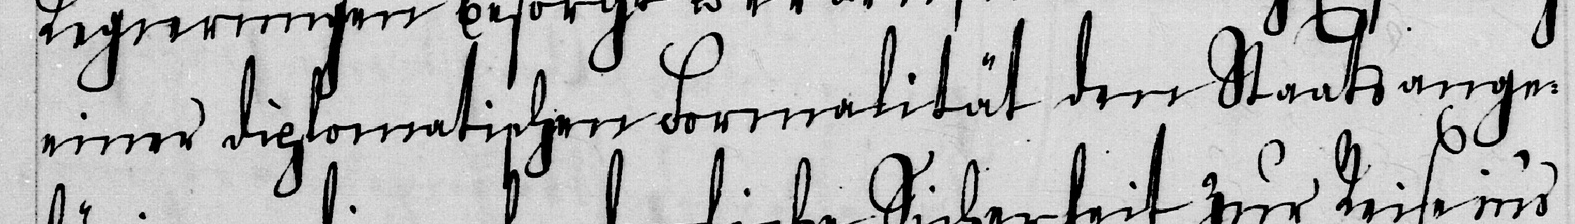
einer diplomatischen Formalität den Staatsange¬
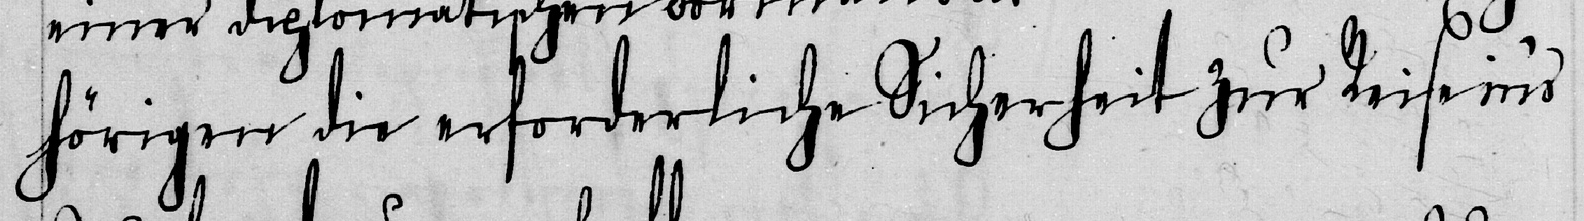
hörigen die erforderliche Sicherheit zur Reise ins
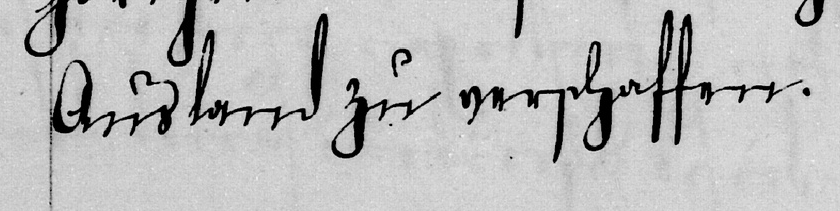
Ausland zu verschaffen.
